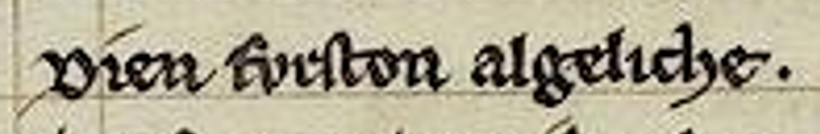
Dien fvrſton algeliche.
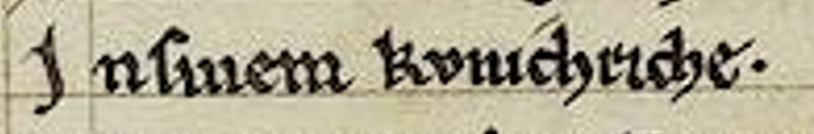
Inſinem kvnichriche.
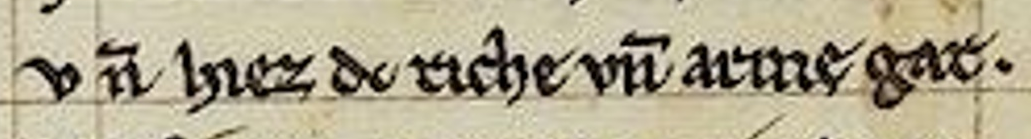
Vn(d) hiez d(az) riche vn(d) arme gar.
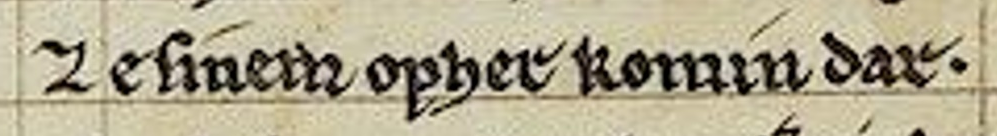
Ze ſinem opher komin dar.
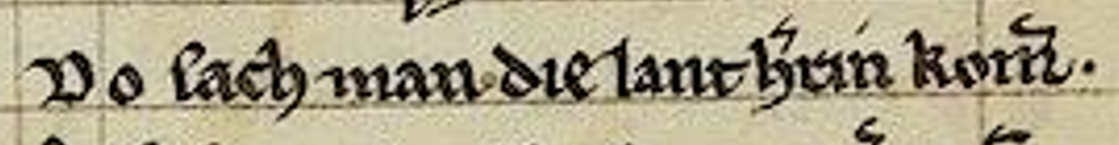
Do ſach man die lant h(er)rin kom(n).
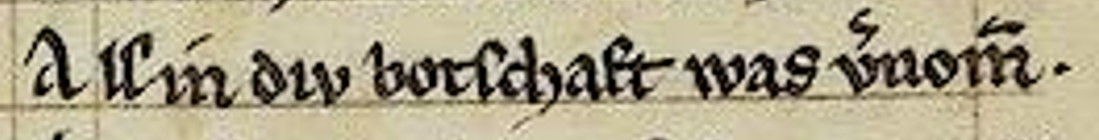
Alſ in div botſchaft was v(er)nom(n).
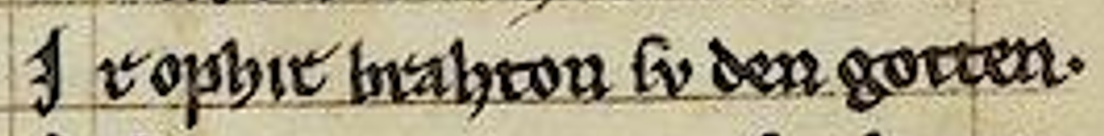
Ir ophir brahton ſv den gotten.
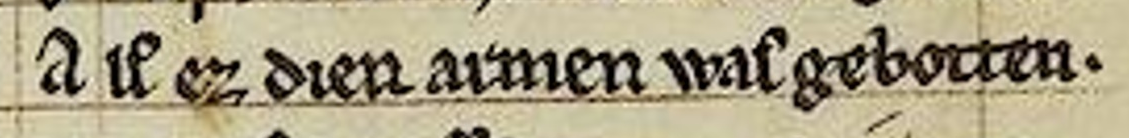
Alſ ez dien armen waſ gebotten.
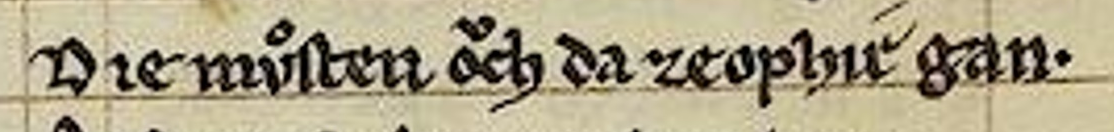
Die mv°oſten o°vch da ze ophir gan.
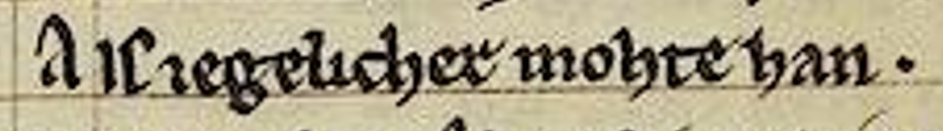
Alſ iegelicher mohte han.
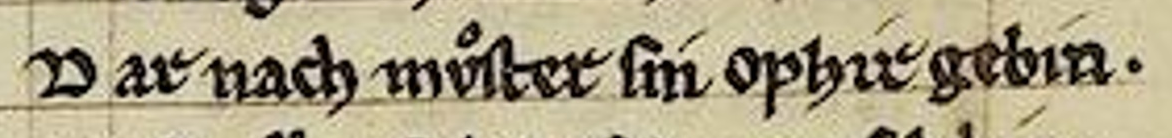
Dar nach mv°oſter ſin ophir gebin.
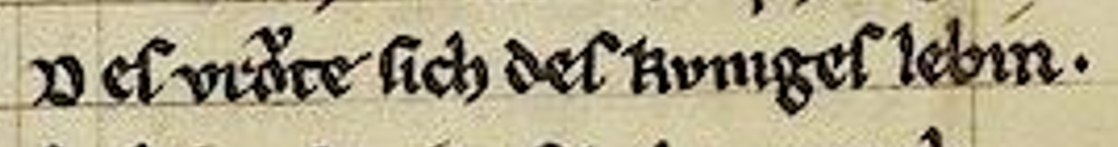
Deſ vro°vte ſich deſ kvnigeſ lebin.
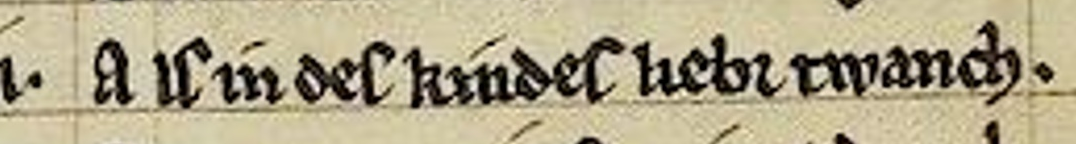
Alſ in deſ kindeſ liebi twanch.
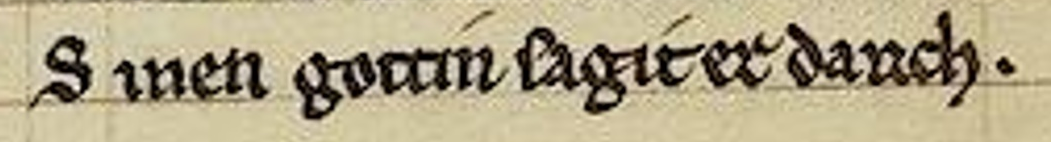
Sinen gottin ſagit er danch.
